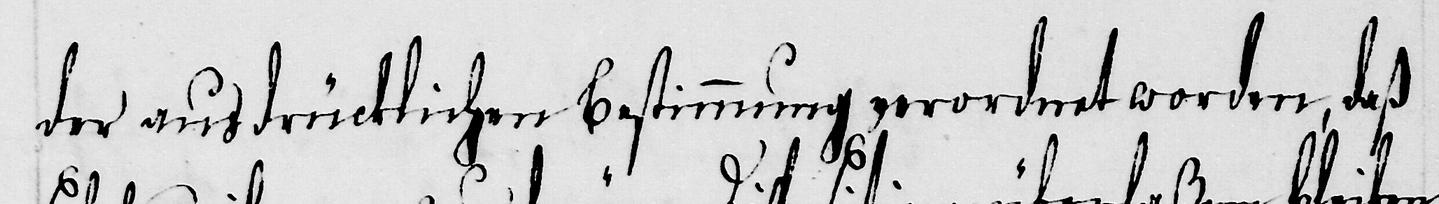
der ausdrücklichen Bestimmung verordnet worden, daß
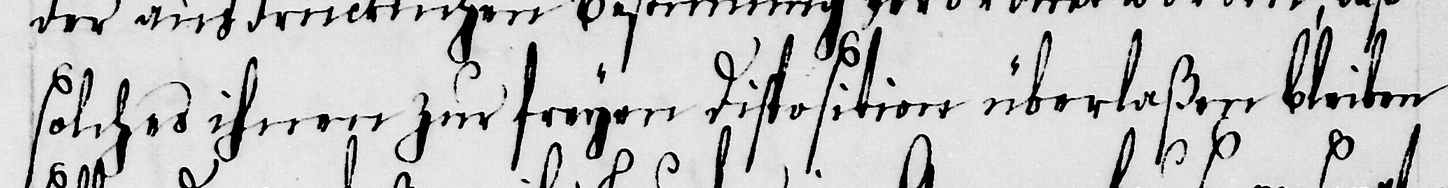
solches ihnen zur freyen Disposition überlaßen bleiben
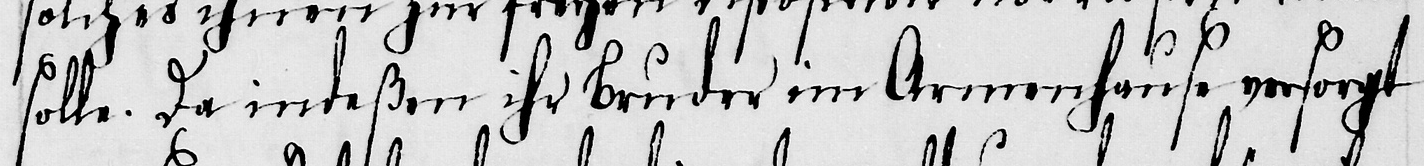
solle. Da indeßen ihr Bruder im Armenhause versorgt
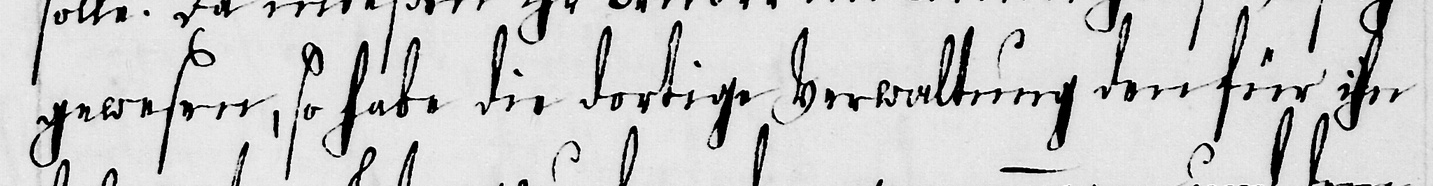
gewesen, so habe die dortige Verwaltung den für ihn
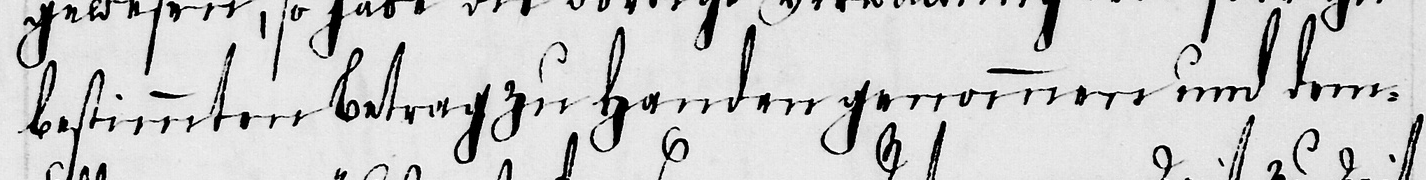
bestimmten Betrag zu Handen genommen und dem¬
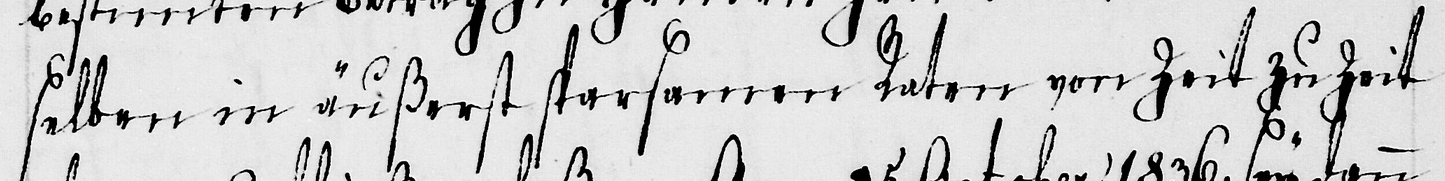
selben in äußerst sparsamen Raten von Zeit zu Zeit
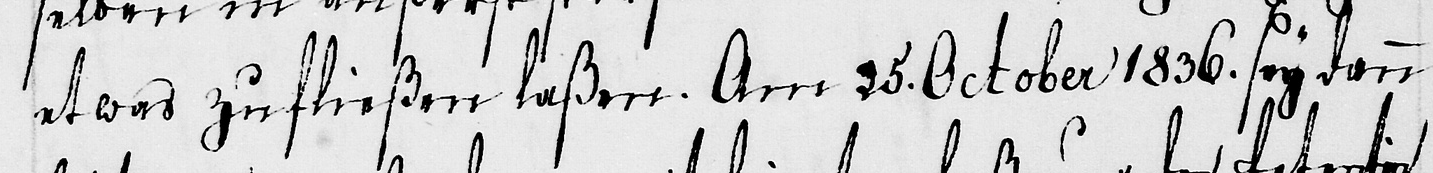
etwas zufließen laßen. Am 25. October1836. sey dann
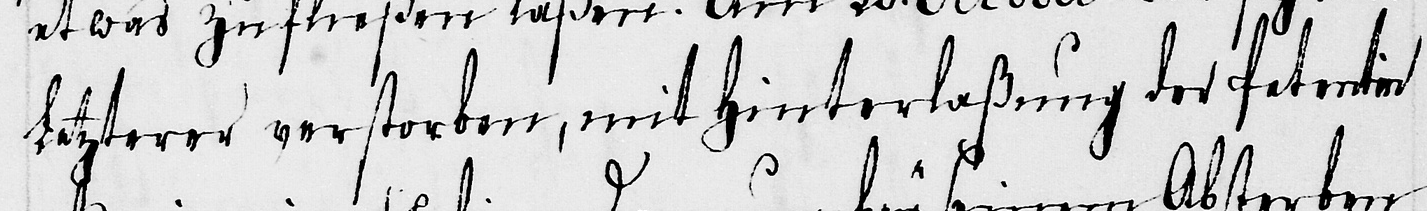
Letzterer verstorben, mit Hinterlaßung der Petentin
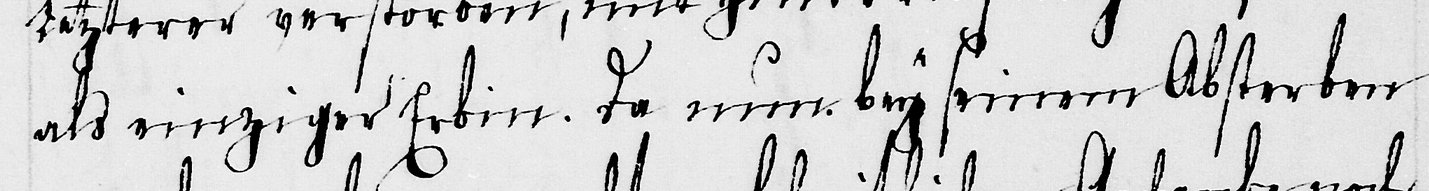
als einziger Erbin. Da nun bey seinem Absterben
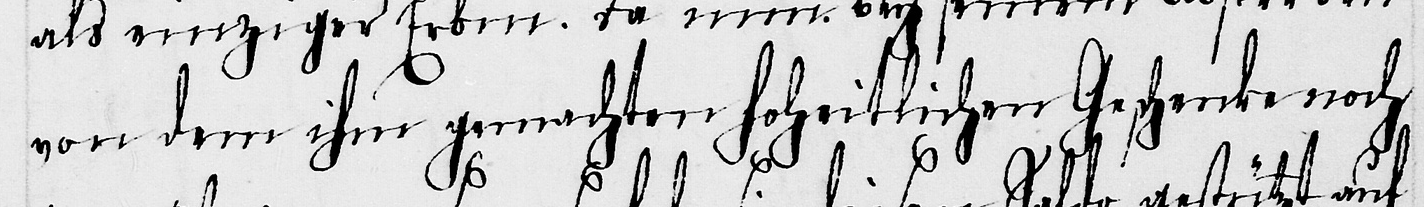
von dem ihm gemachten Hoheitlichen Geschenke noch
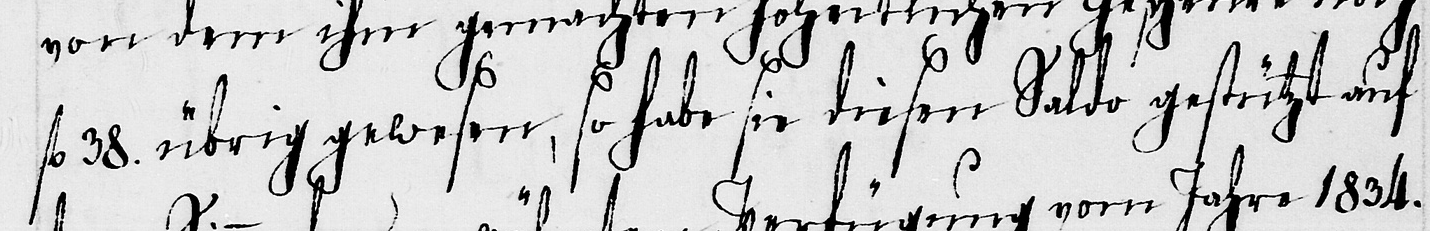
fl. 38. übrig gewesen, so habe sie diesen Saldo gestützt auf
